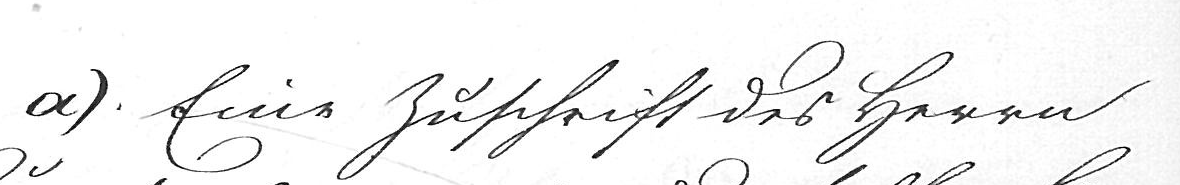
a) Eine Zuschrift des Herrn
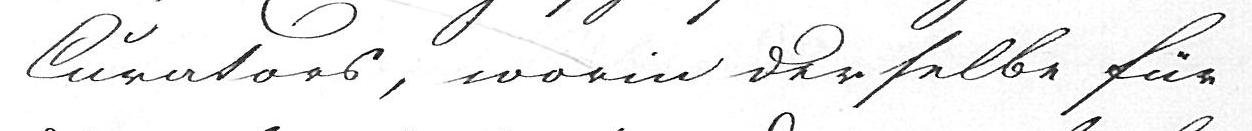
Curators, worin derselbe für
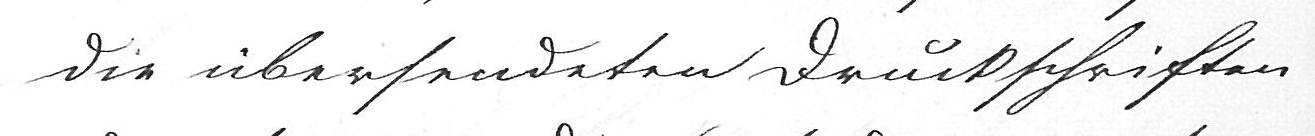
die übersendeten Druckschriften
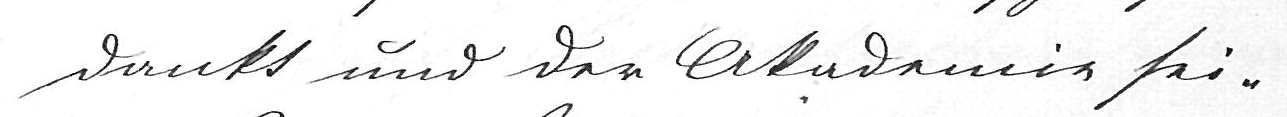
dankt und der Akademie sei-
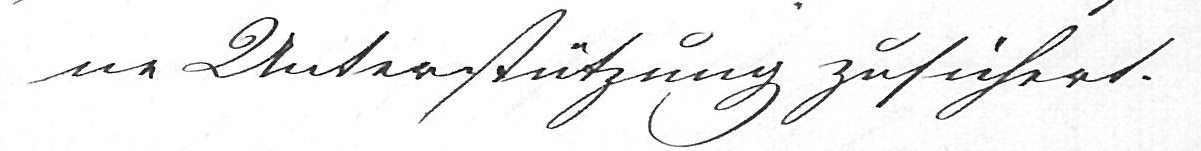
ne Unterstützung zusichert.
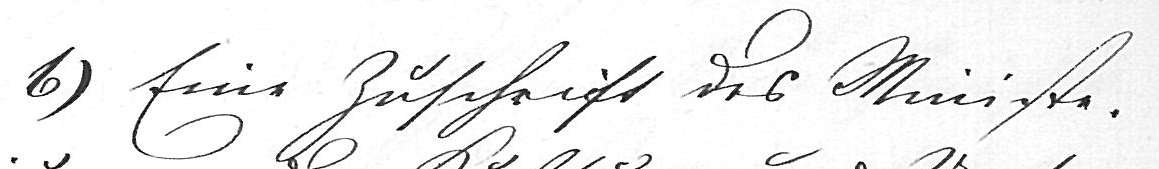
b) Eine Zuschrift des Ministe-
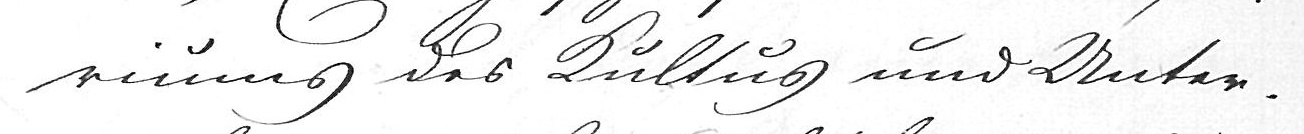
riums des Kultus und Unter-
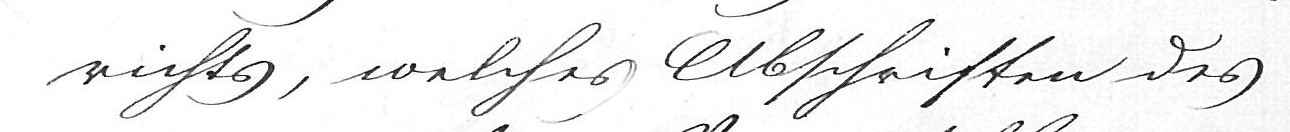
richts, welches Abschriften des
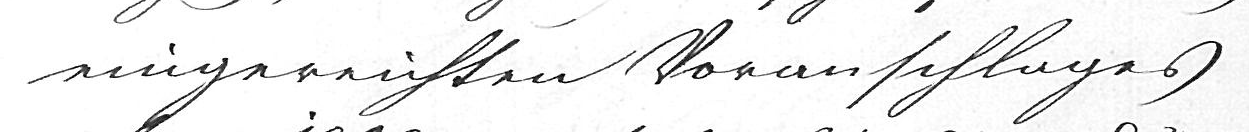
eingereichten Voranschlages
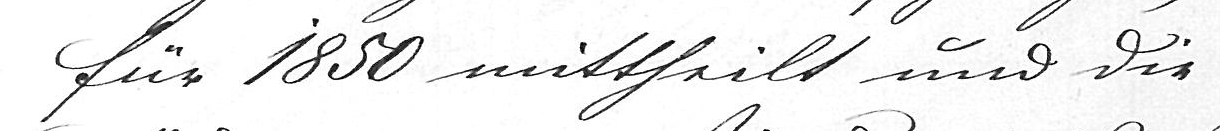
für 1850 mittheilt und die
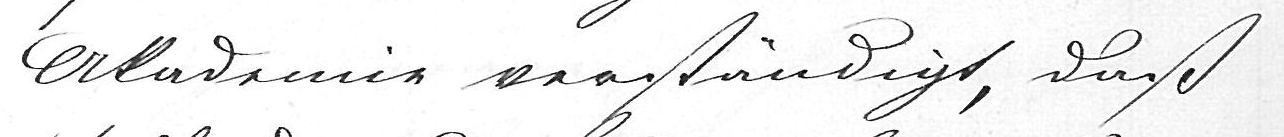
Akademie verständigt, daß
